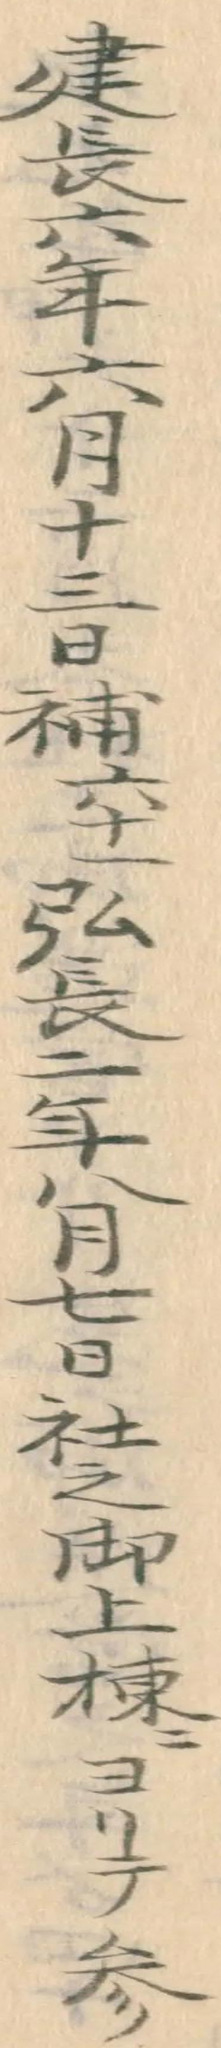建長六年六月十三日補六十一弘長二年八月七日社之御上様ニヨリテ参
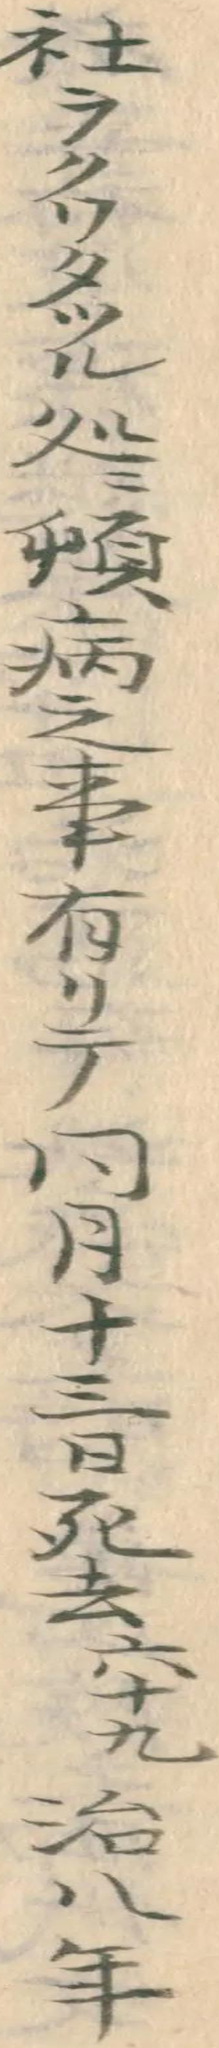社ヲクワタツル処ニ頓病之事有リテ同月十三日死去六十九治八年
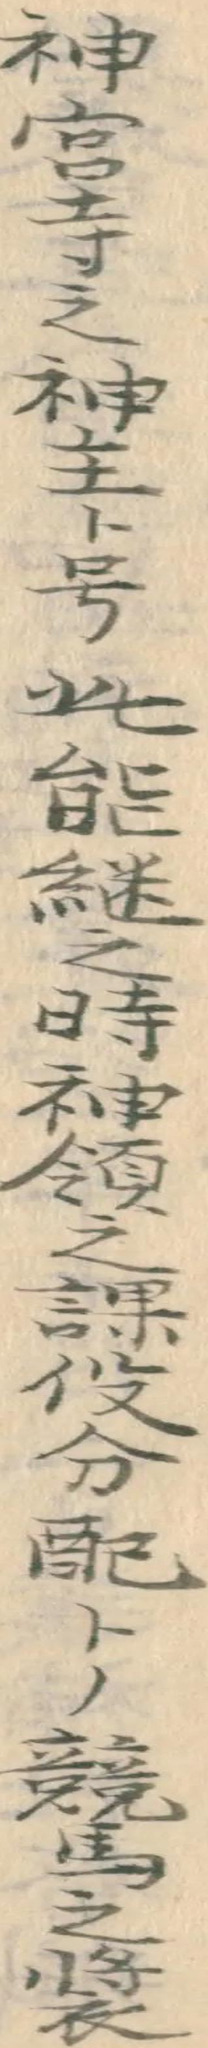神宮寺之神主ト号此能継之時神領之課役分配トノ競馬之装
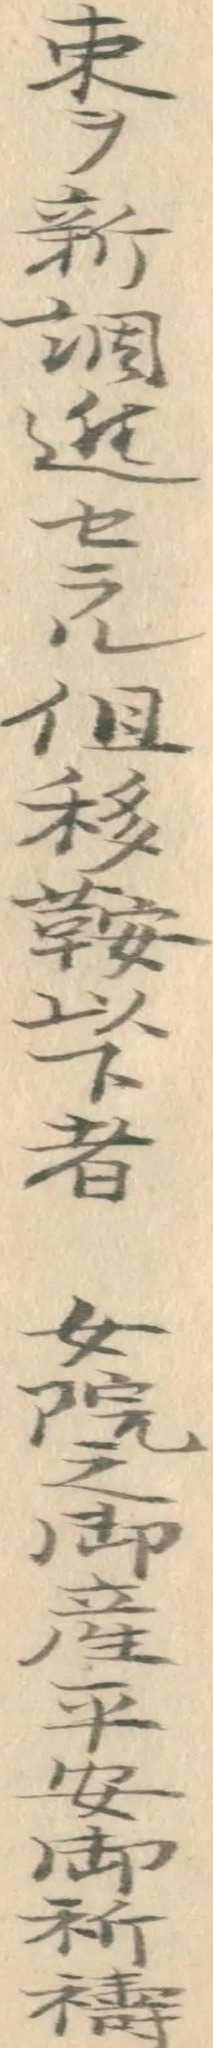束ヲ新調進セラル但移鞍以下者女院之御産平安御祈祷
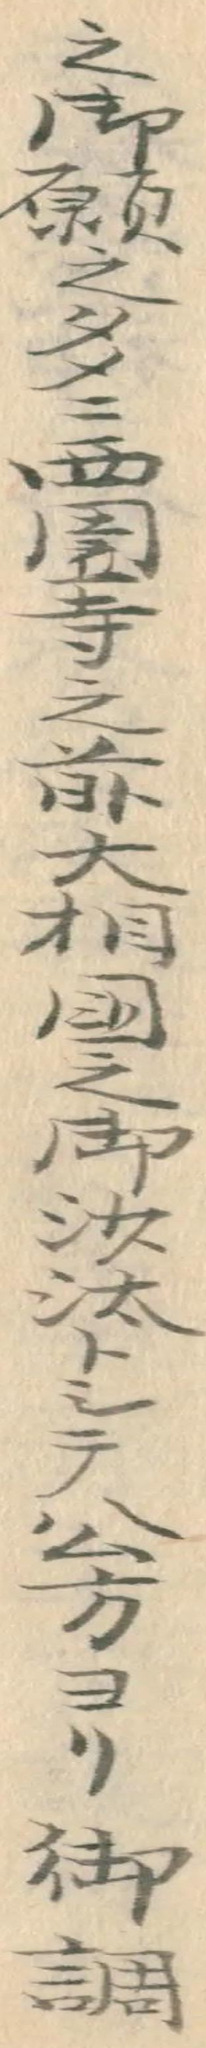之御願之タメニ西園寺之前大相国之御沙汰トシテ公方ヨリ御調
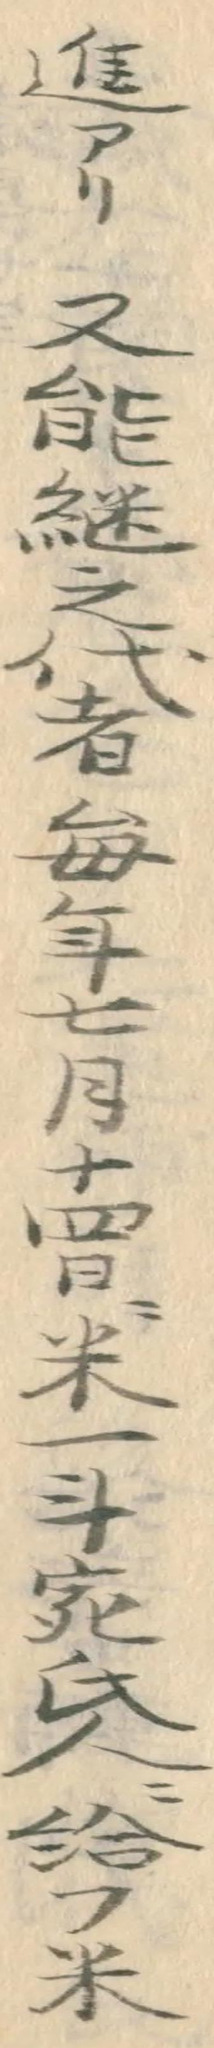進アリ又能継之代者毎年七月十四日ニ米一斗宛氏人ニ給フ米
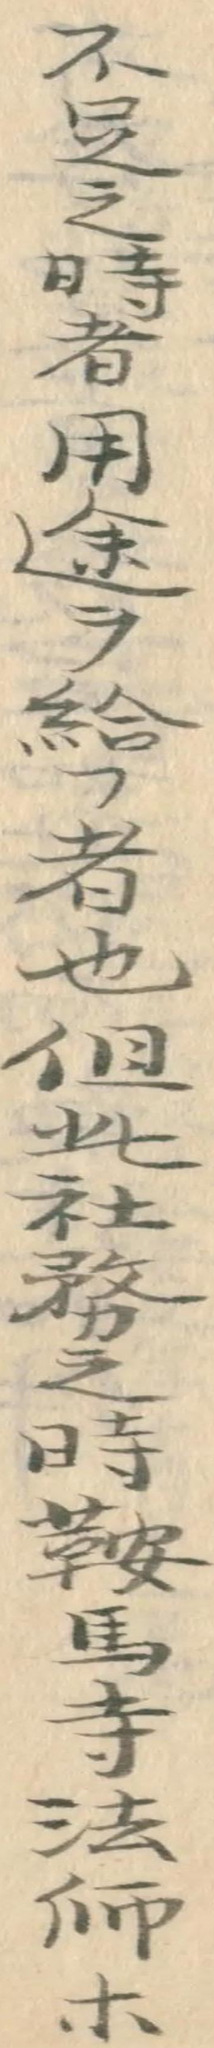不足之時者用途ヲ給フ者也但此社務之時鞍馬寺法師等
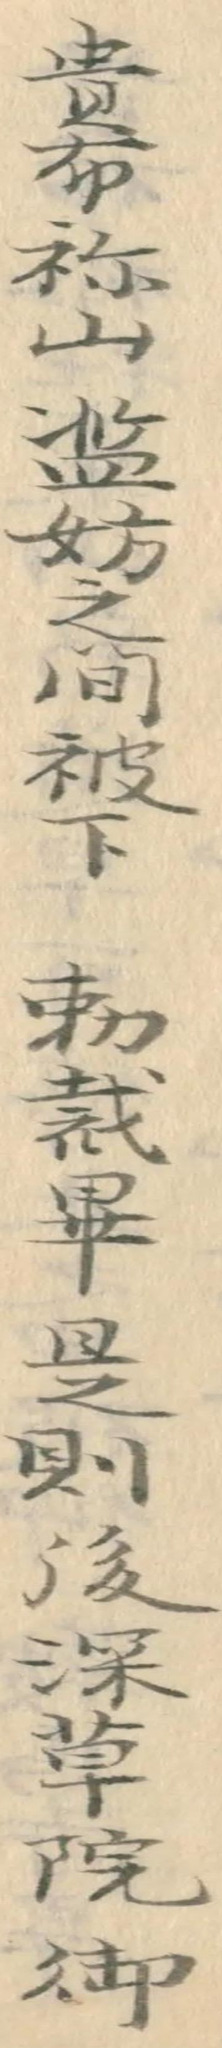貴布祢山濫妨之間被下勅裁畢是則後深草院御
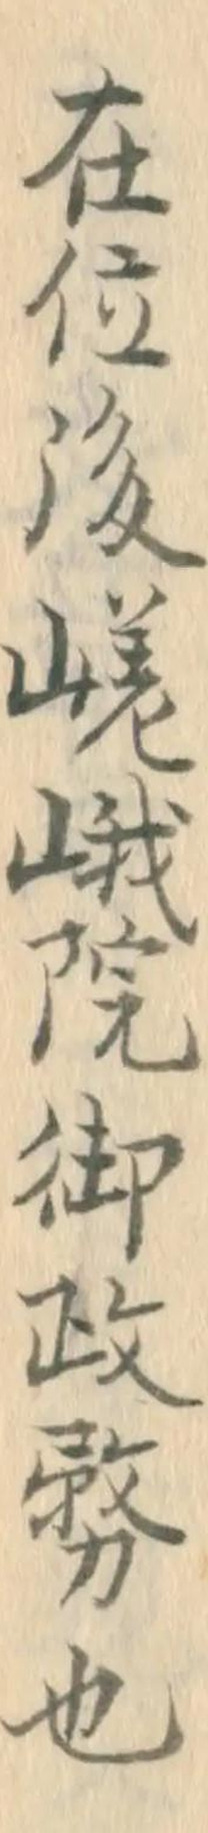在位後嵯峨院御政務也

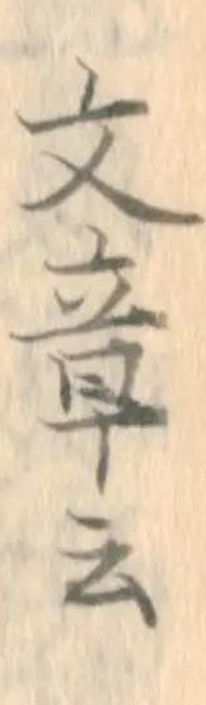文章云
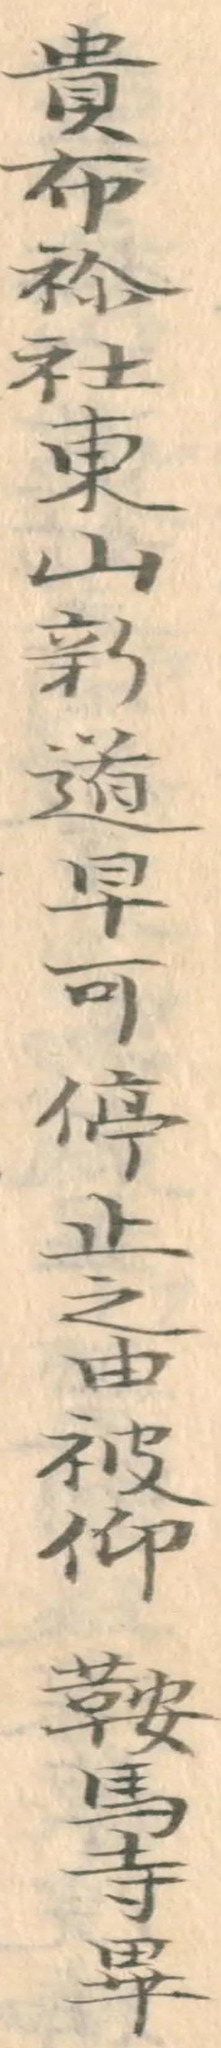貴布祢社東山新道早可停止之由被仰鞍馬寺畢
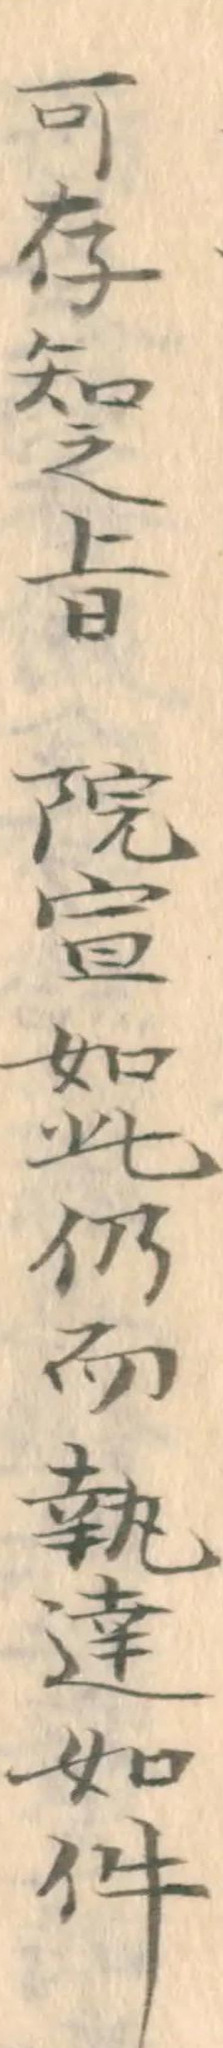可存知之旨院宣如此仍而執達如件
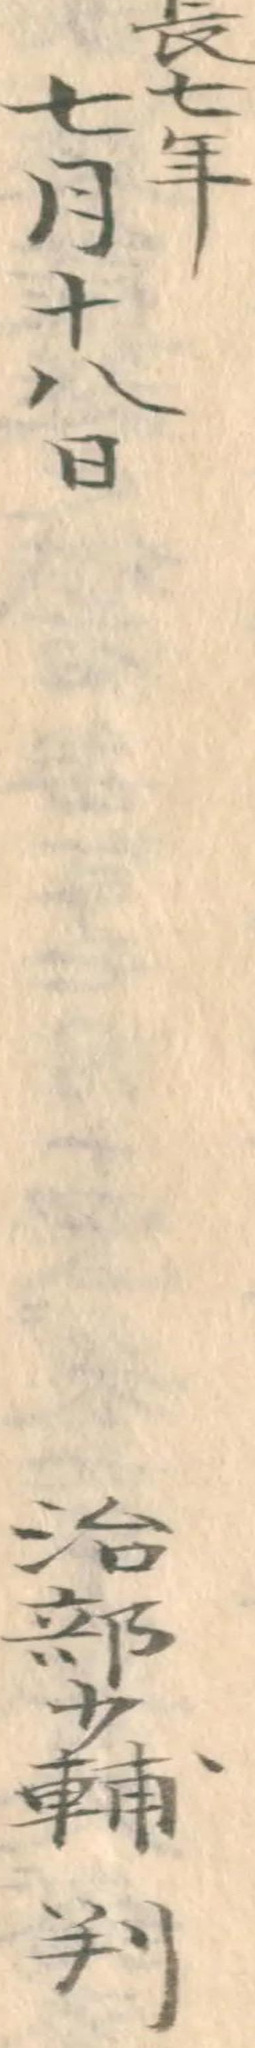七月十八日治部少輔判
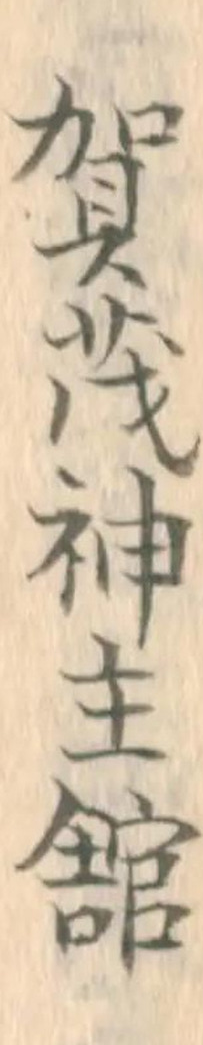賀茂神主館
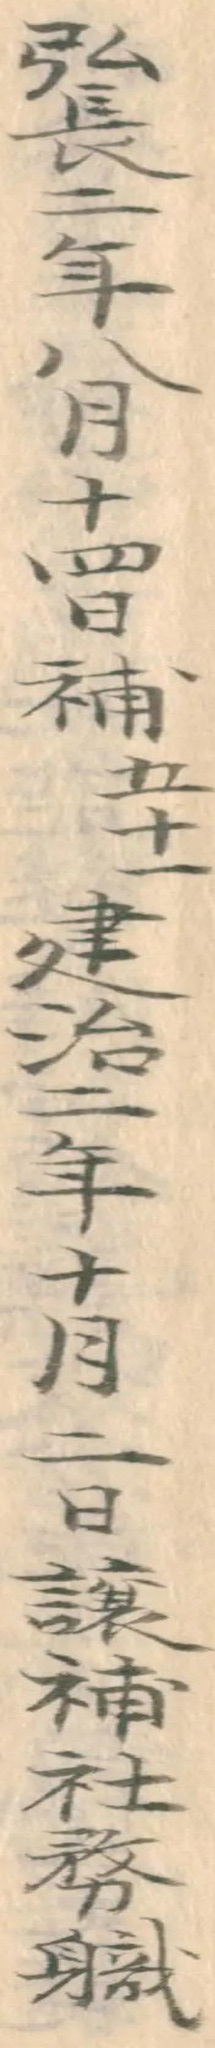弘長二年八月十四日補五十一建治二年十月二日譲補社務職
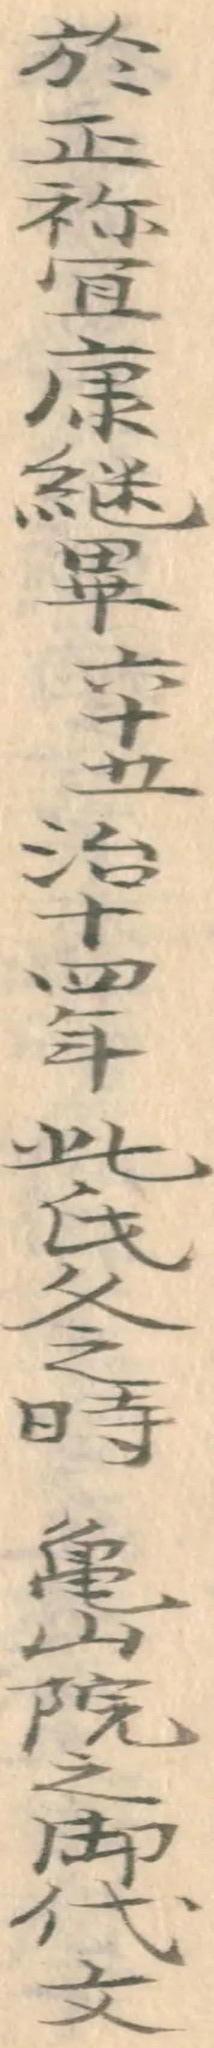於正祢宜康継畢六十五治十四年此氏久之時亀山院之御代文
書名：賀茂社記録. 第24冊
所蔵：国立国会図書館 National Diet Library, JAPAN
